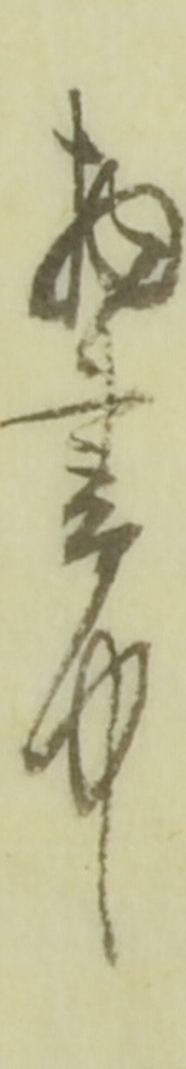物書中
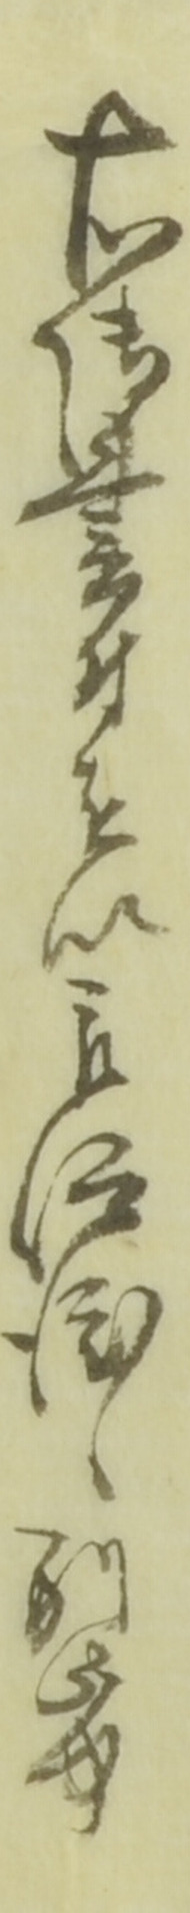右御書付を以被仰渡候別紙
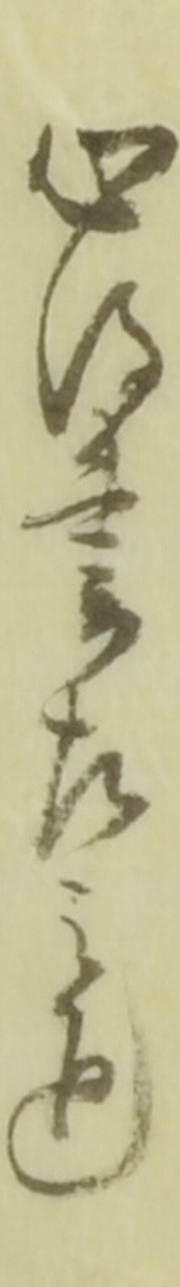心得書左之通
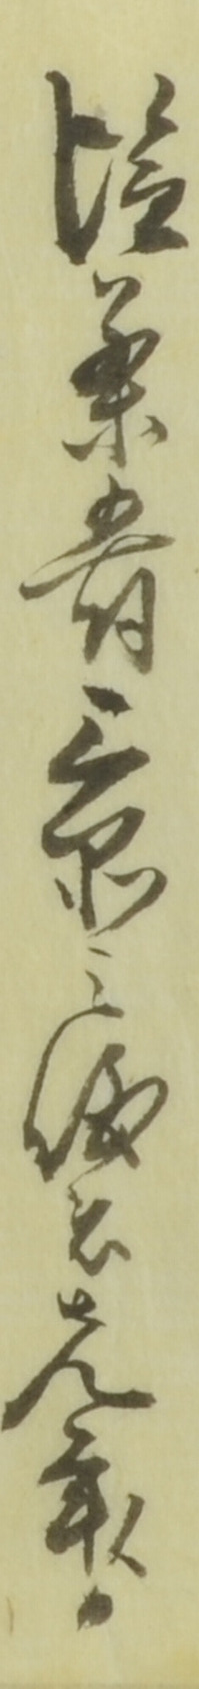塩茶肴三品之儀者先年〳〵
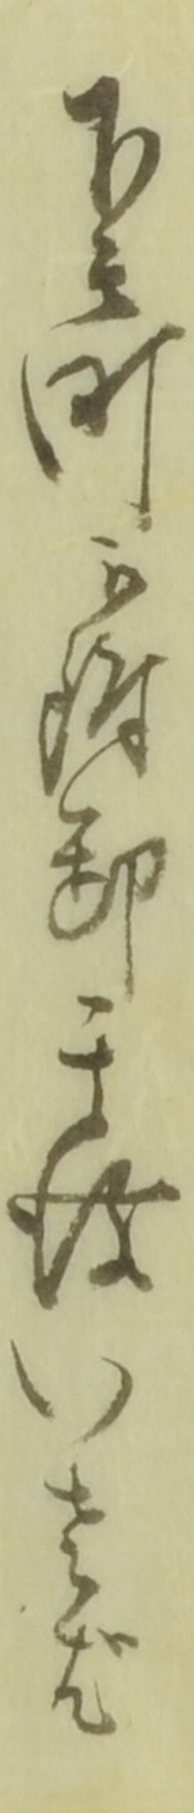下モ町被附卸其後いさば
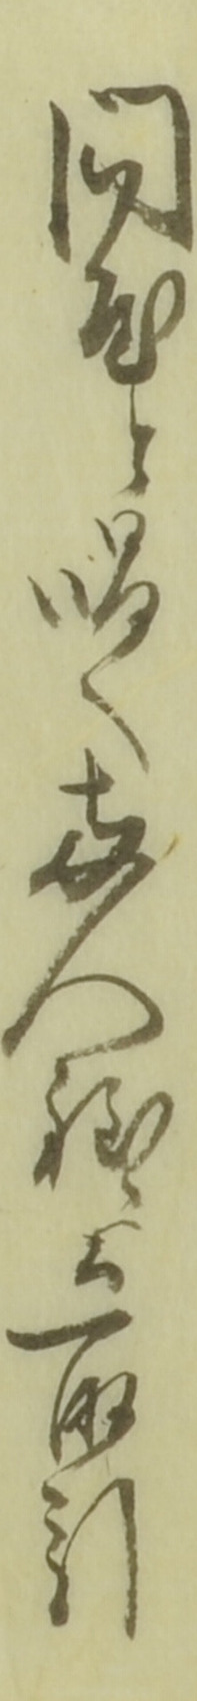問屋と唱へ両人様々而取引
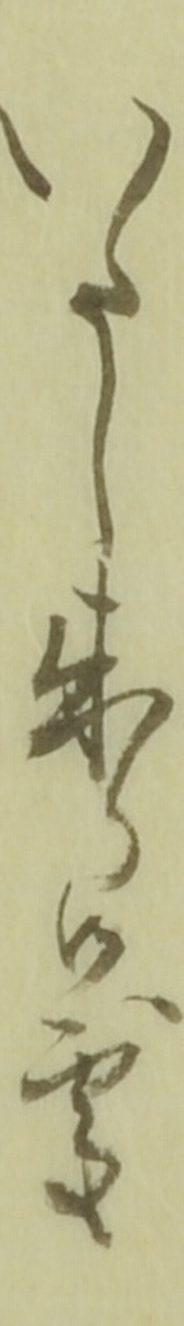いたし来リ候処
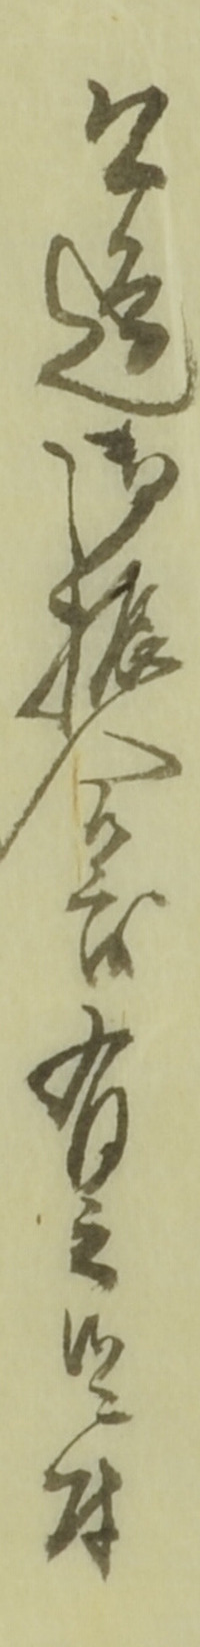公道御振合茂有之候ニ付
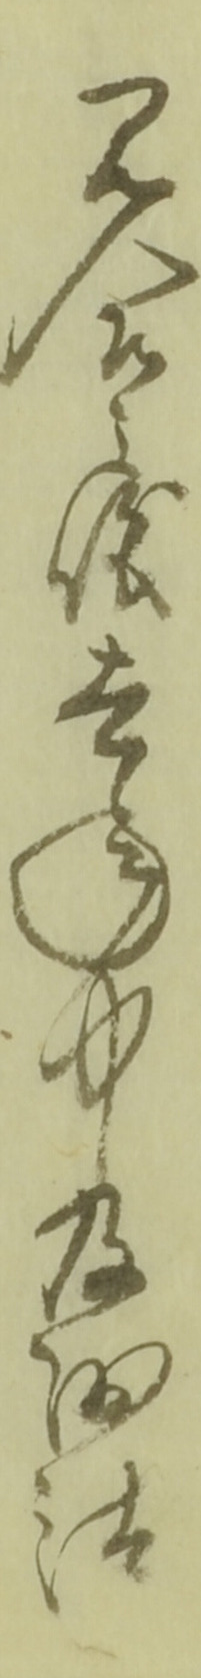見合之儀去年中及沙汰
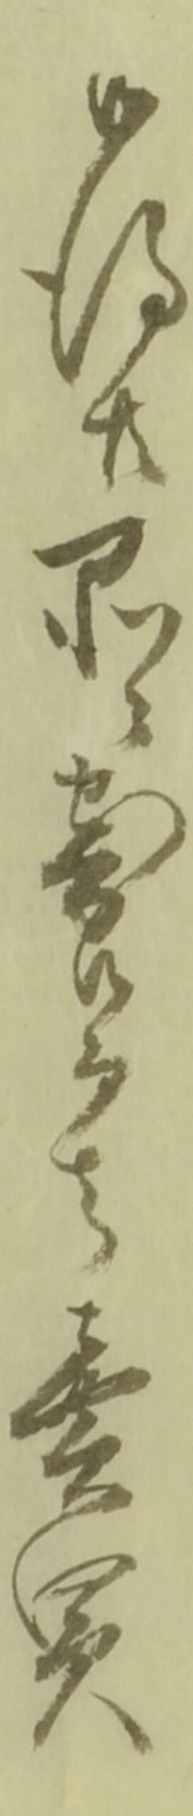候得共品々寄候而者売買
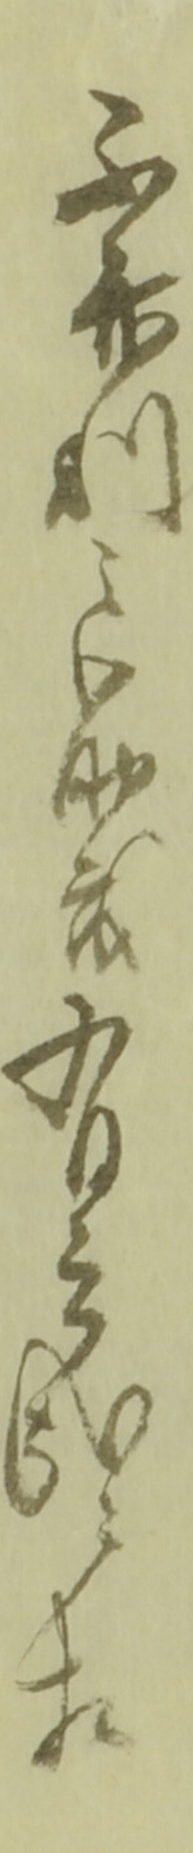不弁利之筋茂有之哉々相
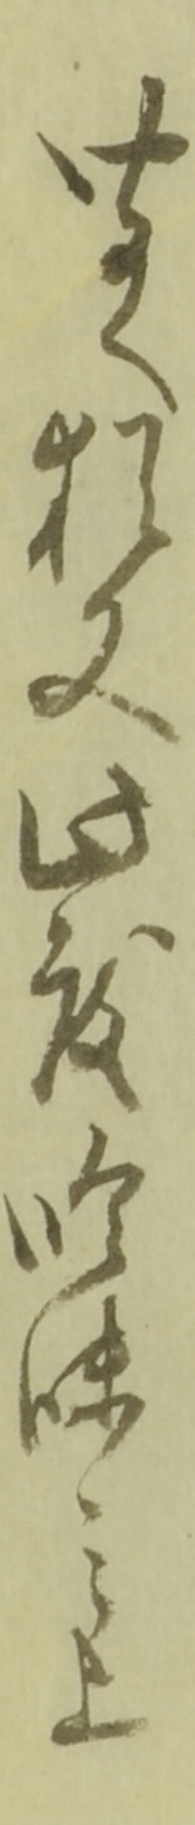聞へ猶又此度吟味之上
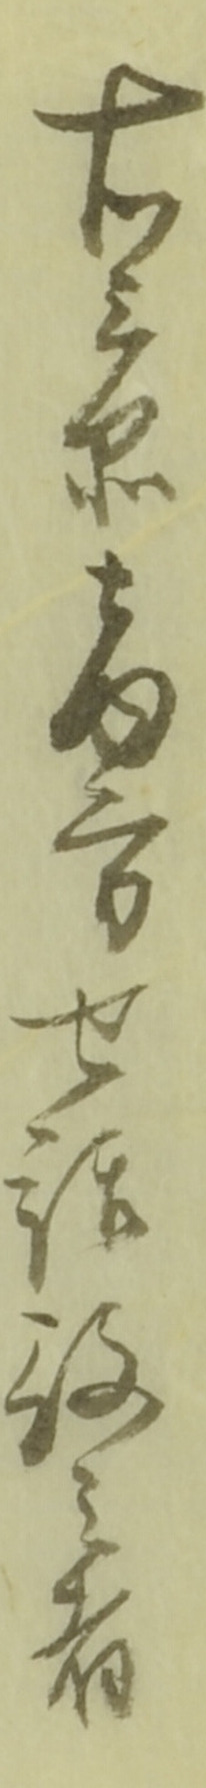右三品商方せ話役之者
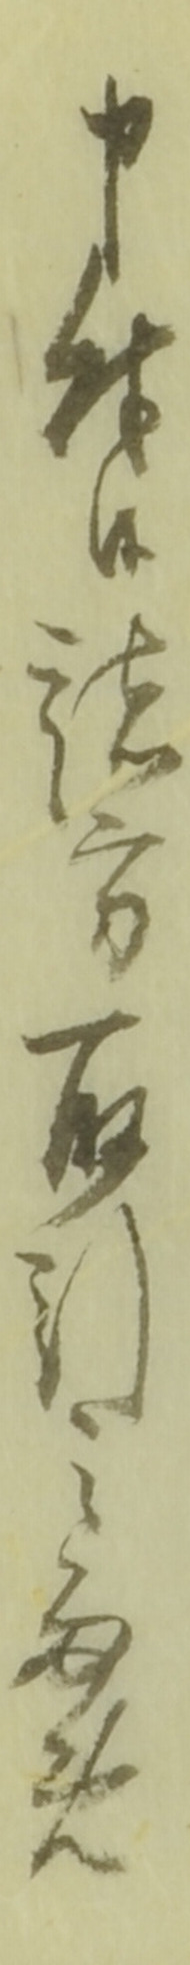申付候諸方取引之ため
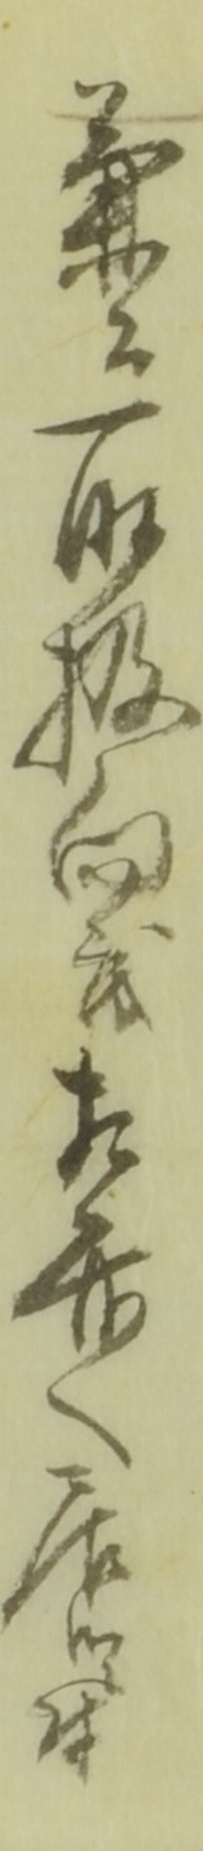兼々取扱向茂相弁へ居候ニ付
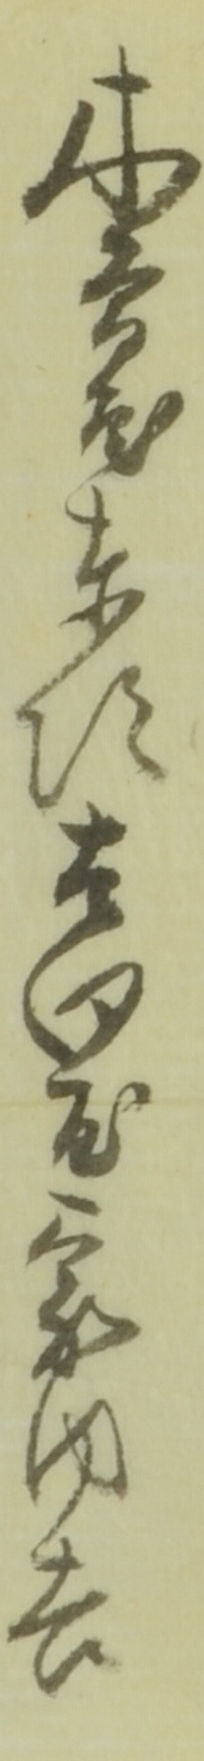木曽屋東す吉田屋家内吉
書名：御触書御書附控
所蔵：伊那市立高遠町図書館・合同会社AMANE
